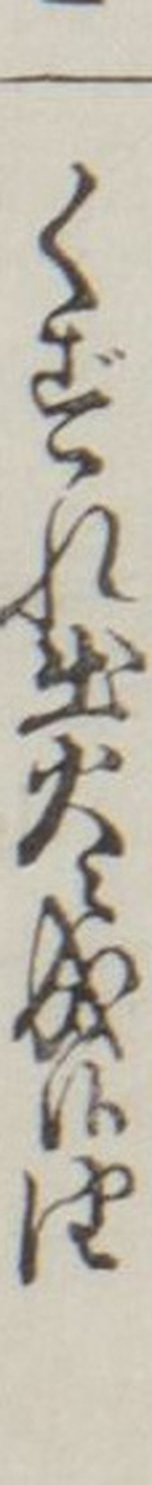くずれ出火に成候由
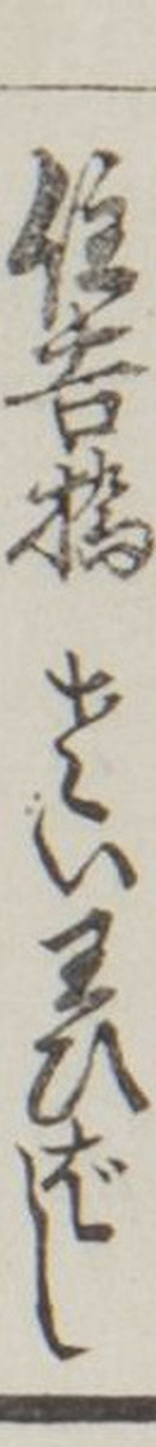住吉橋さいわひばし
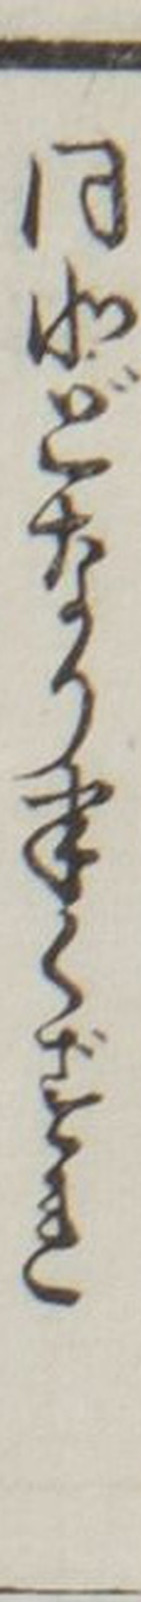同北どなり半くずれ
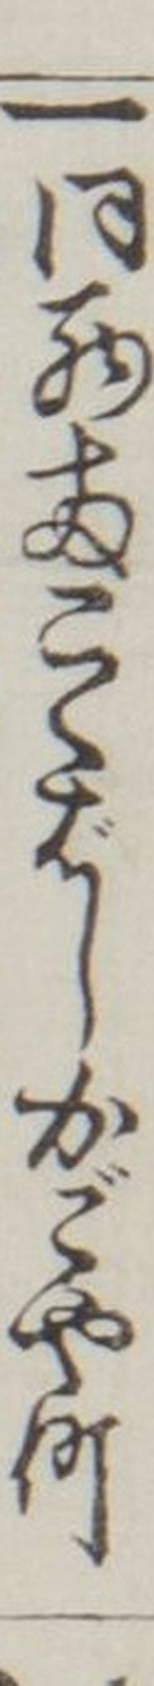一同西両こくばしかごや町
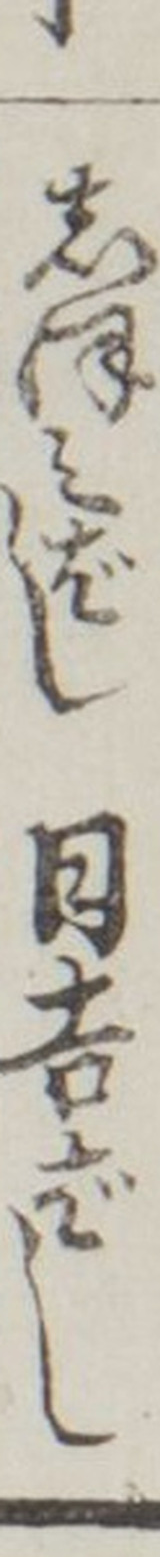しほみばし日吉ばし
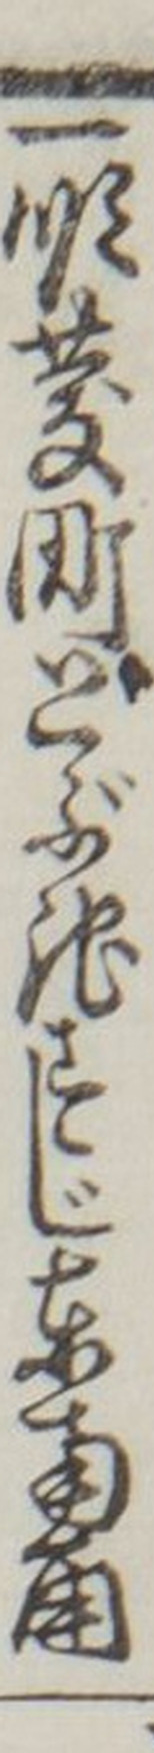一順慶町どぶ池すじ東南角
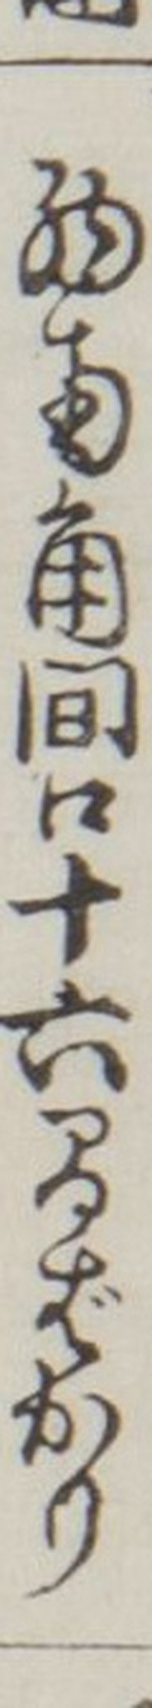西南角間口十六間ばかり
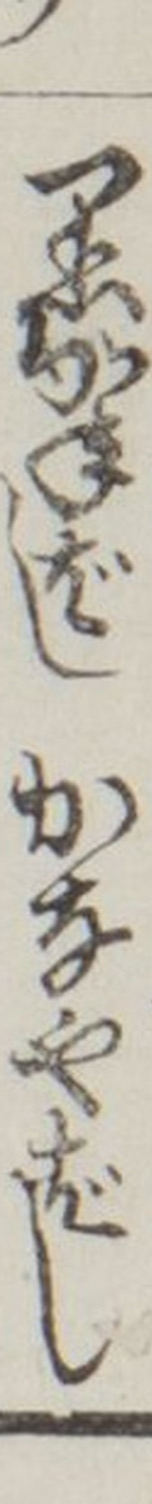黒かねばしかなやばし
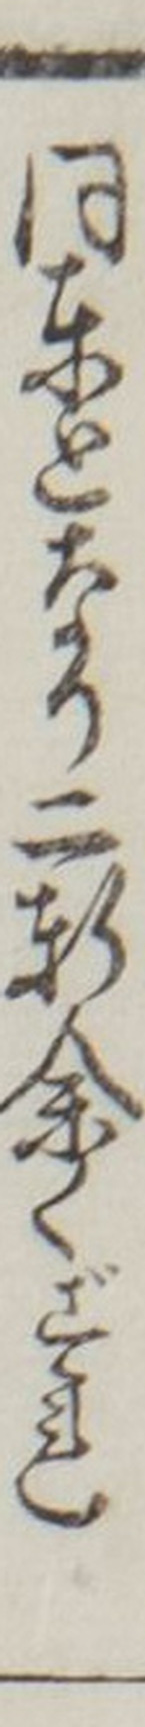同東となり二軒余くずれ
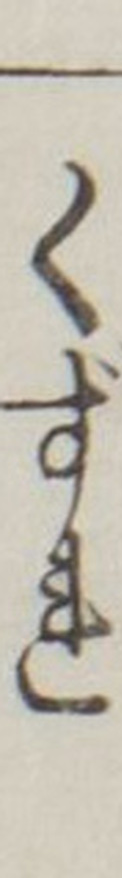くずれ
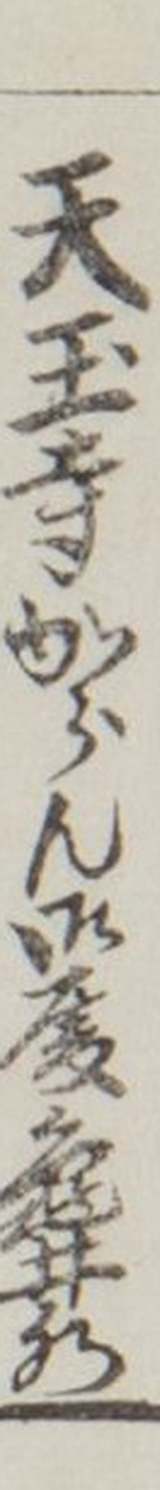天王寺からん御殿亀井水
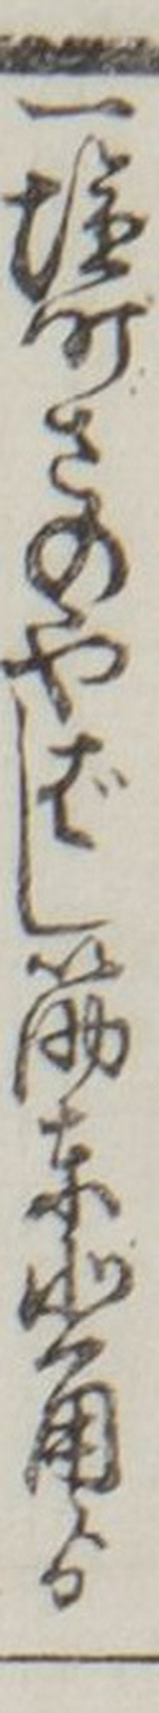一塩町さのやばし筋東北角より
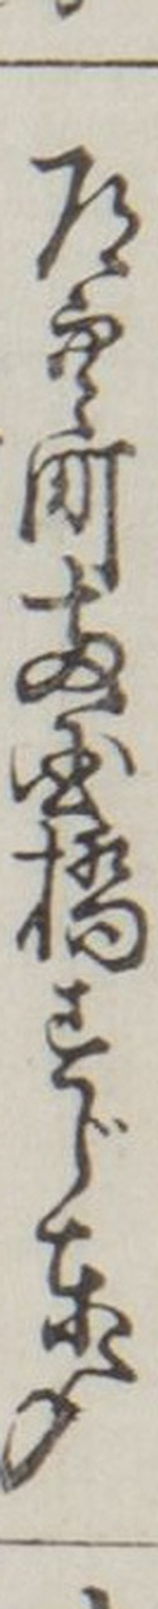道空町両国橋すじ東に入
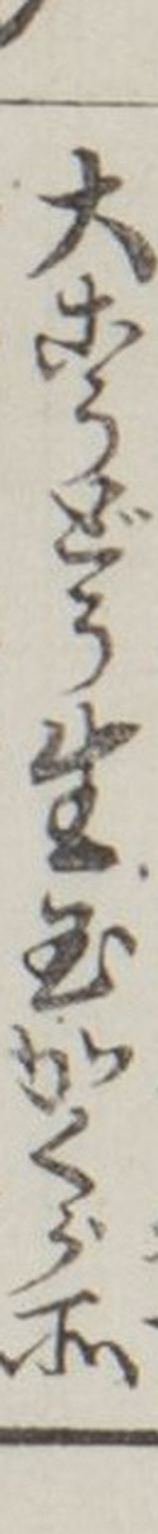大こうどう生玉かくら所
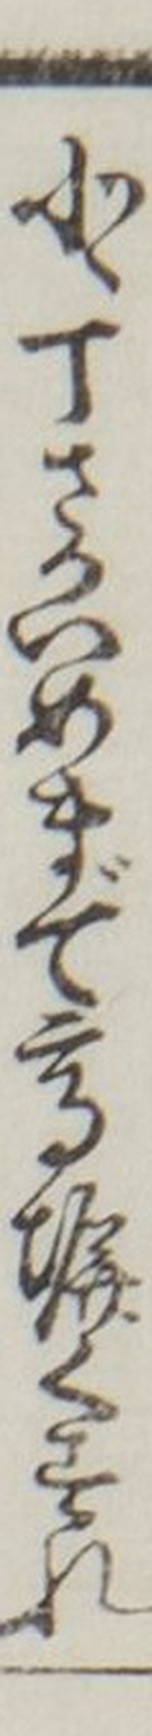北へ丁さかいめまで高塀くすれ
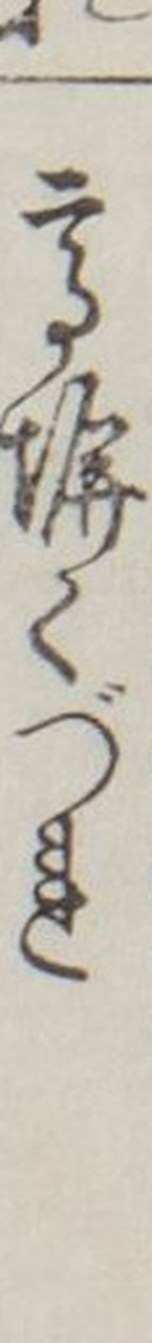高塀くづれ
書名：本志らべ大阪大地震大破略記
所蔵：あいおいニッセイ同和損保株式会社
